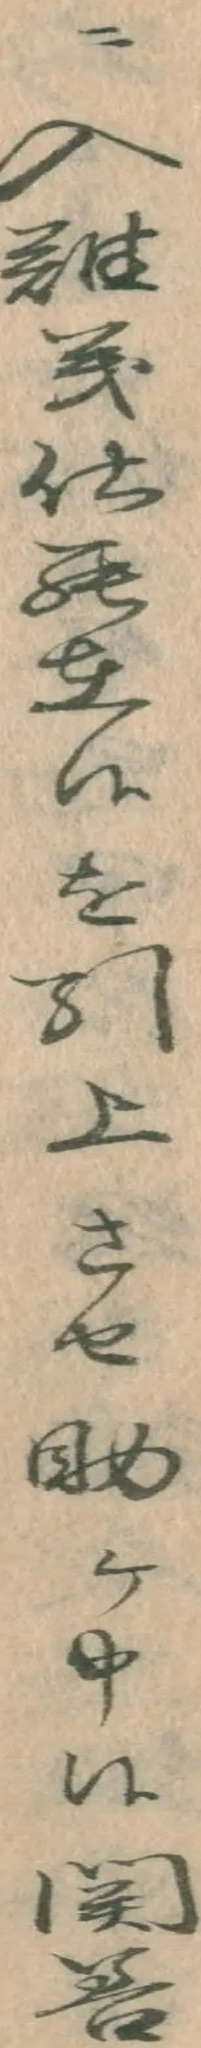に入難義仕罷在候を引上させ助け申候関善
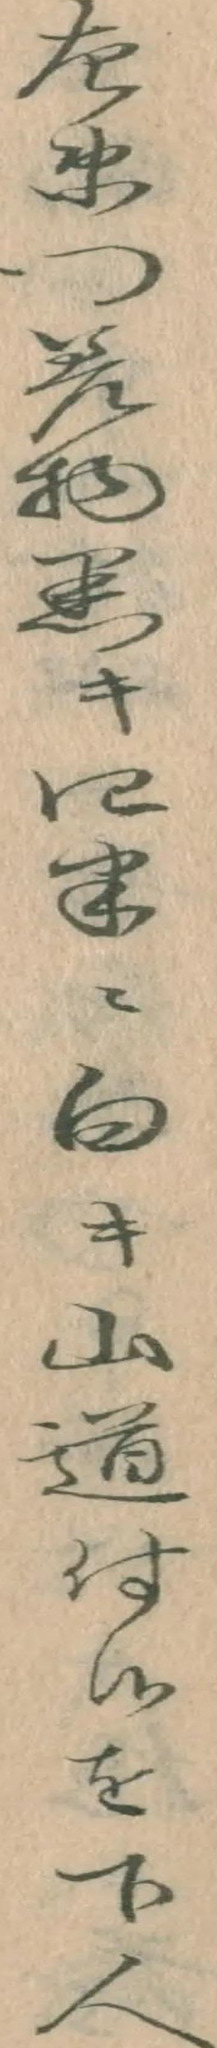左衛門差物黒き四半に白き山道付候を下人
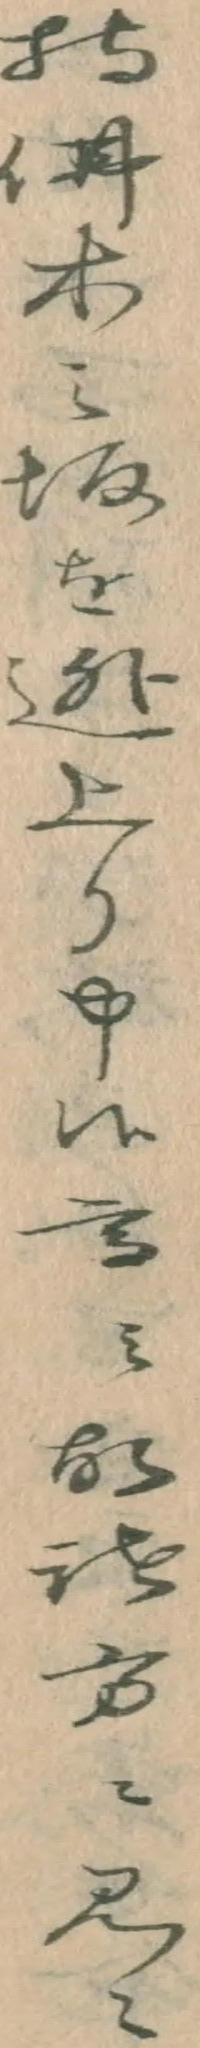持佛木之坂を逃上り申候高み故諸方に見に
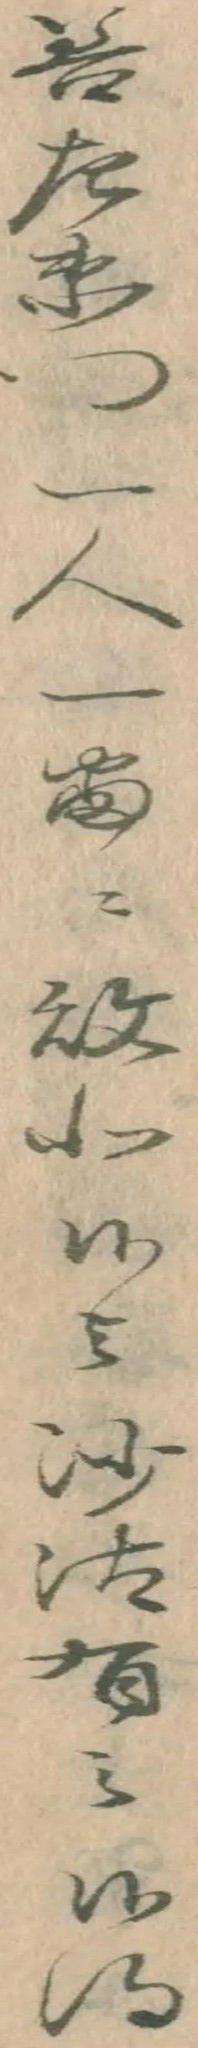善左衛門一人一番に敗北候与沙汰有之候得
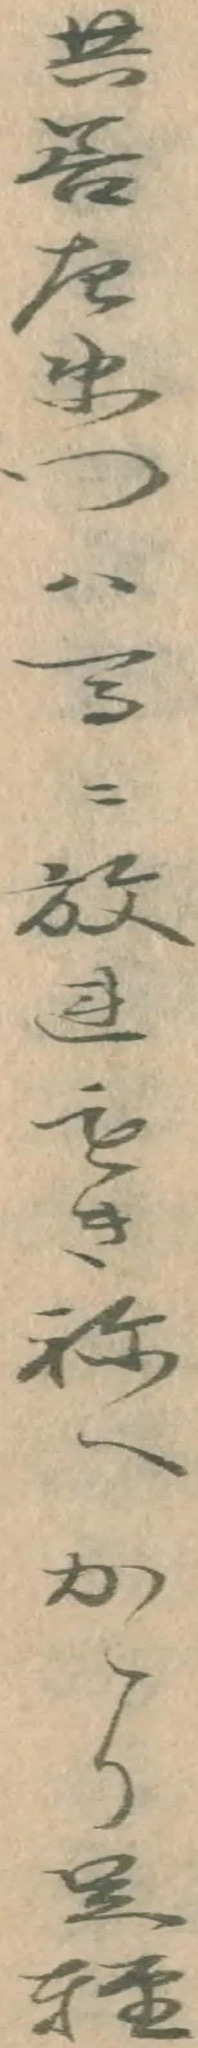共善左衛門は馬に放連飛き祢へかゝり足軽

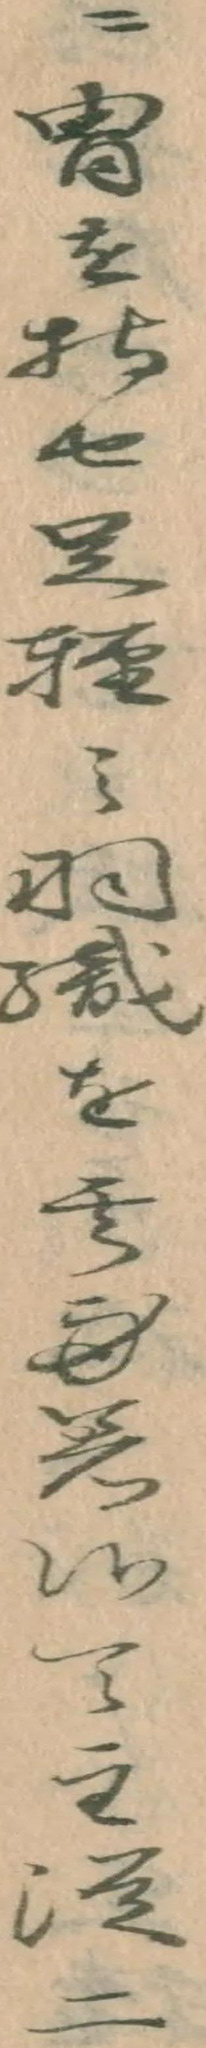に冑を持せ足軽之羽織を其身着候て主従二
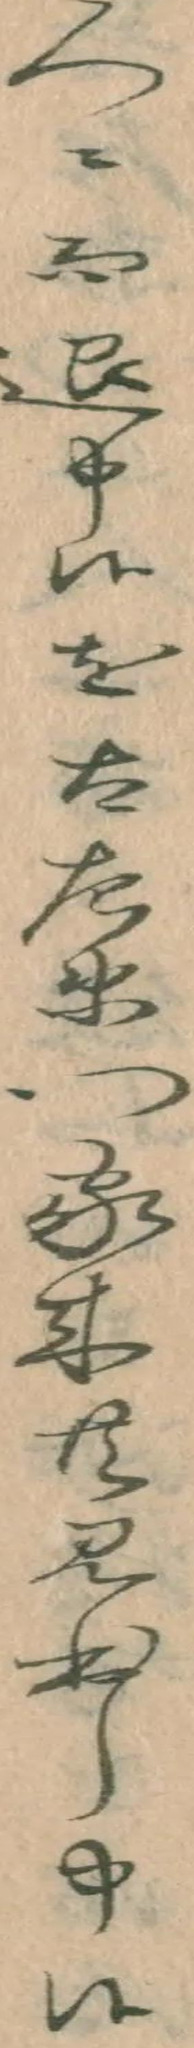人に而退申候を太左衛門家来共見出し申候
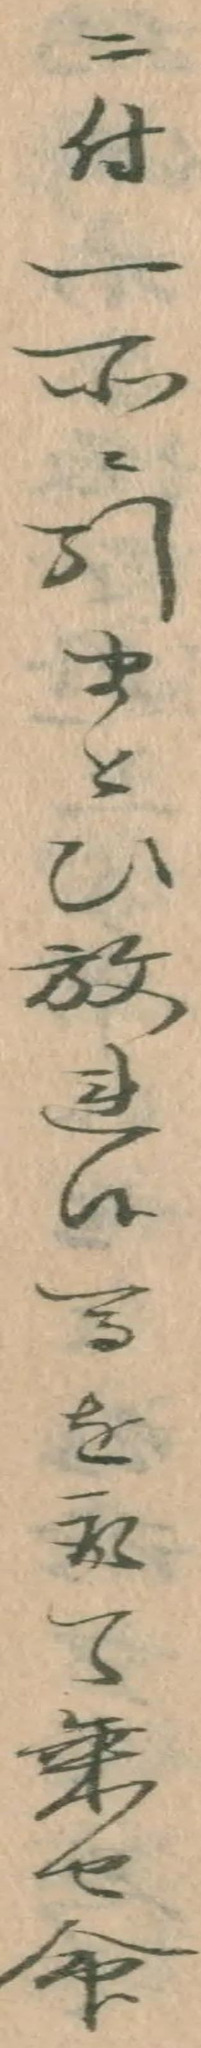に付一所に引まとひ放連候馬を取て乗せ命
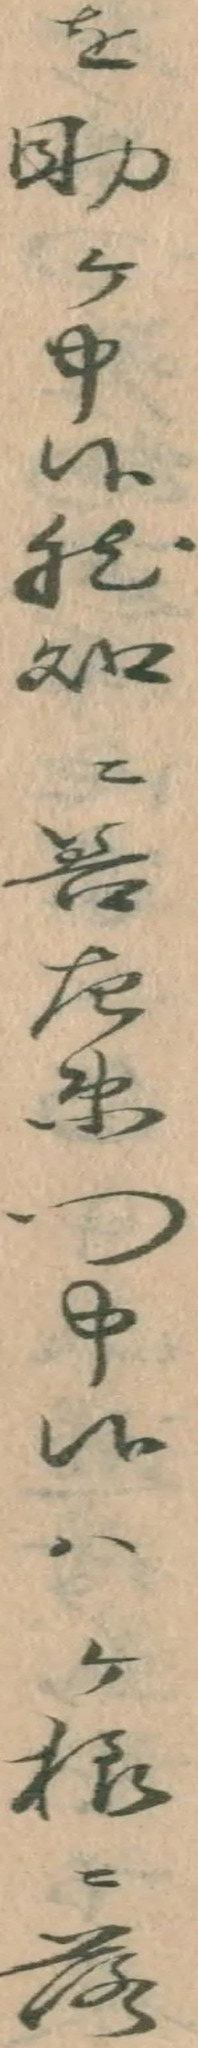を助け申候然処に善左衛門申候はけ様に落
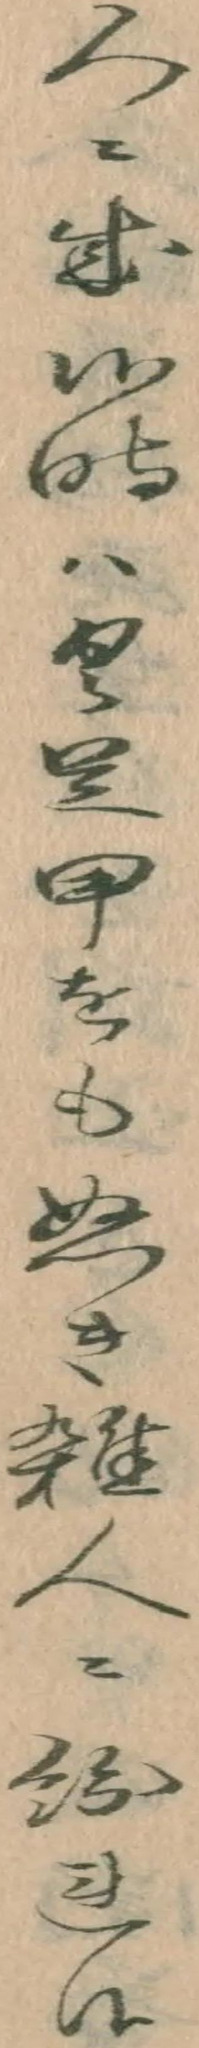人に成候時は具足甲をも怒き雑人に紛連候
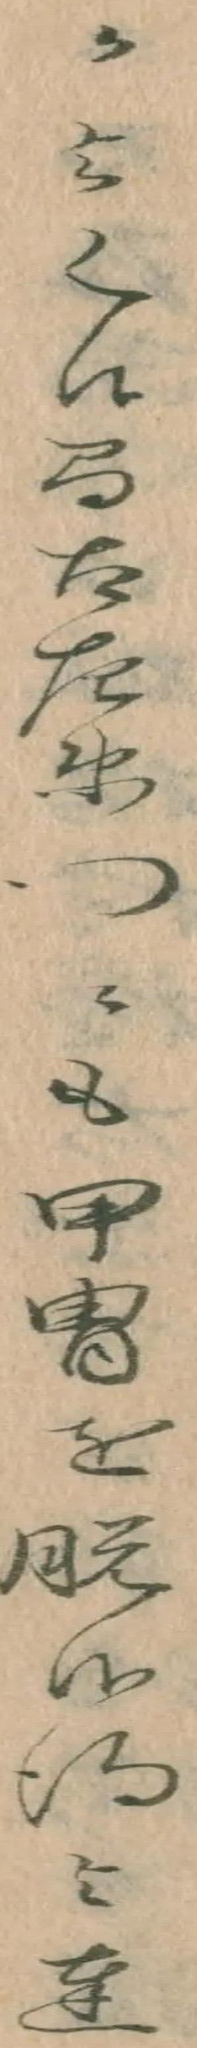か与く候間太左衛門にも甲冑を脱候得与達
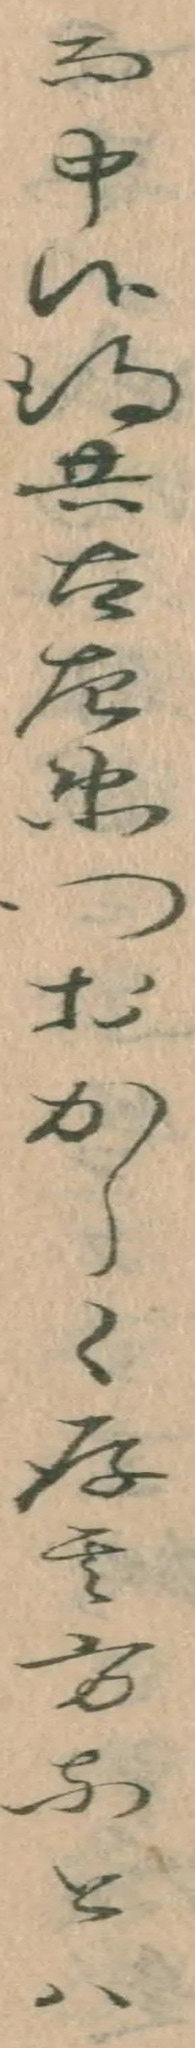而申候得共太左衛門おかしく存其方なとは
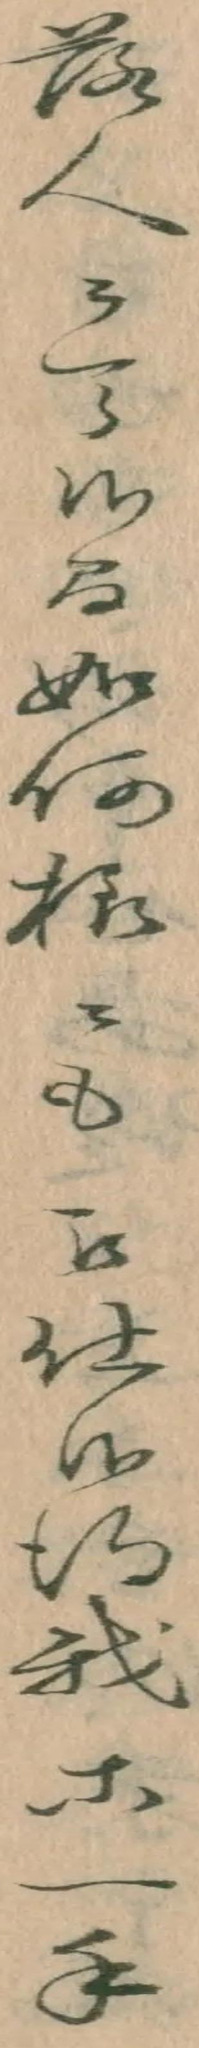落人にて候間如何様にも被仕候得我等一手
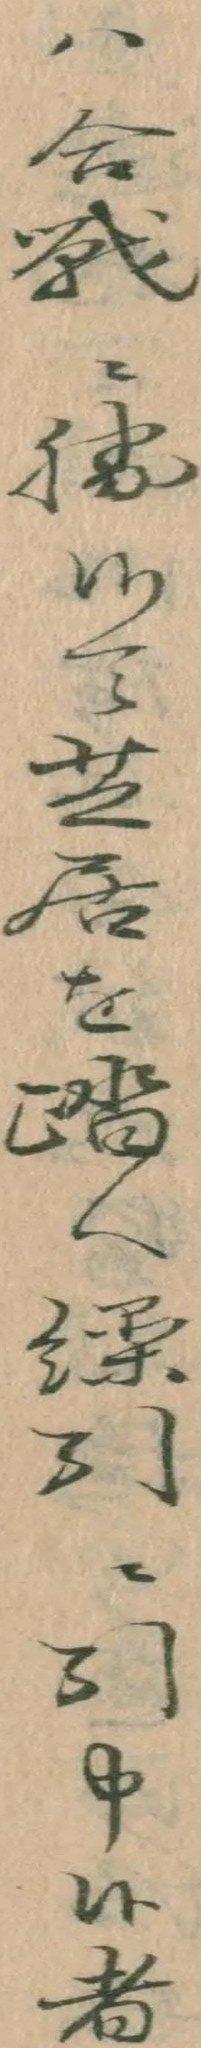は合戦に勝候て芝居を踏へ繰引に引申候者
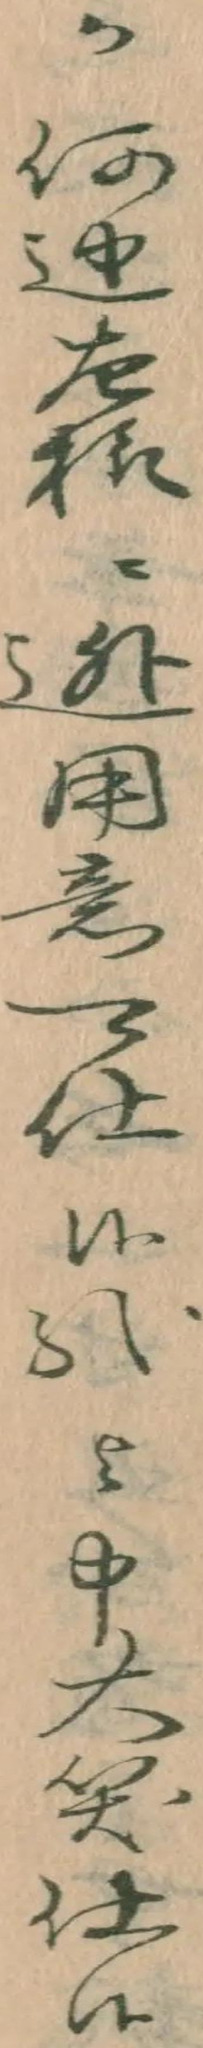か何迚左様に逃用意可仕候哉与申大笑仕候
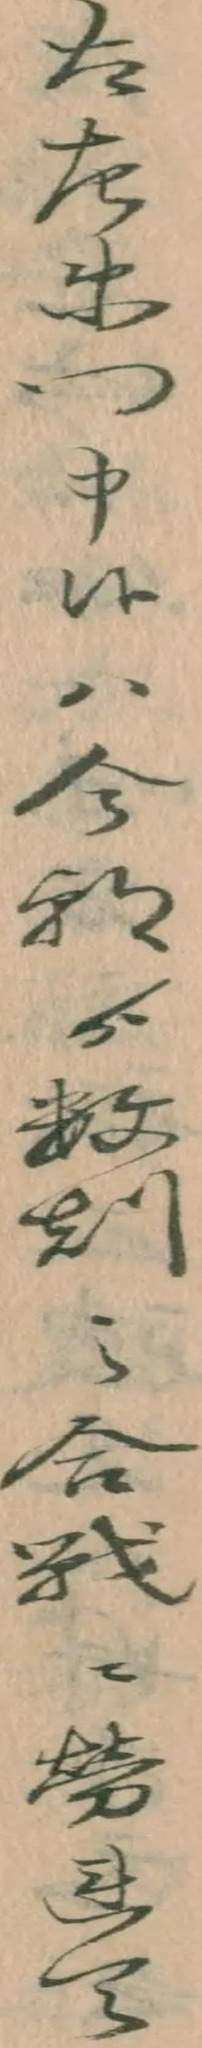太左衛門申候は今朝ゟ数刻之合戦に勞連て
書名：切支丹御退治記 49巻. [2]
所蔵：国立国会図書館 National Diet Library, JAPAN
